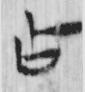占
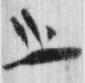之
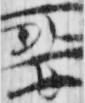恆
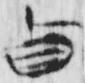貞
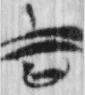吉
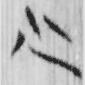少
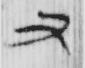又（有）
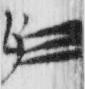於
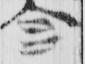宮
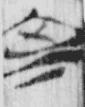室
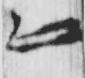㠯
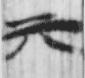亓
